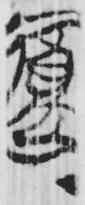○（復）
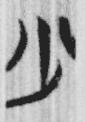少（小）
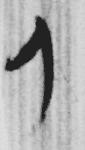人
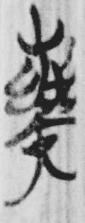藥（樂）
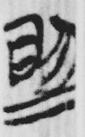則（則）
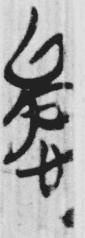○（疑）
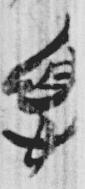憂
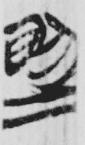則（則）
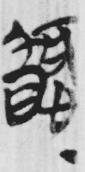○（昏）
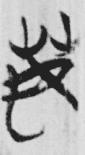○（怒）
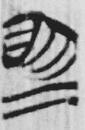則（則）
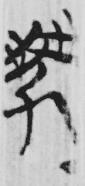○（勝）
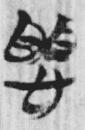愳（懼）
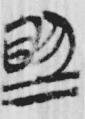則（則）
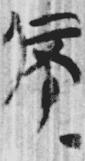伓（倍）
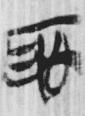恥
